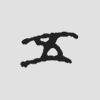五
